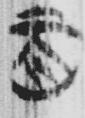百
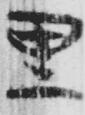里
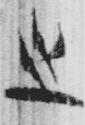之
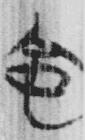{宀𠁩}
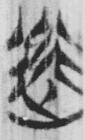○（率）
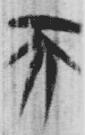天
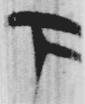下
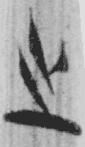之
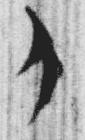人
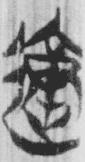○（就）
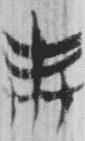奉
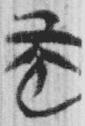而
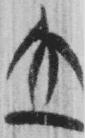立
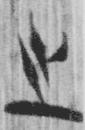之
